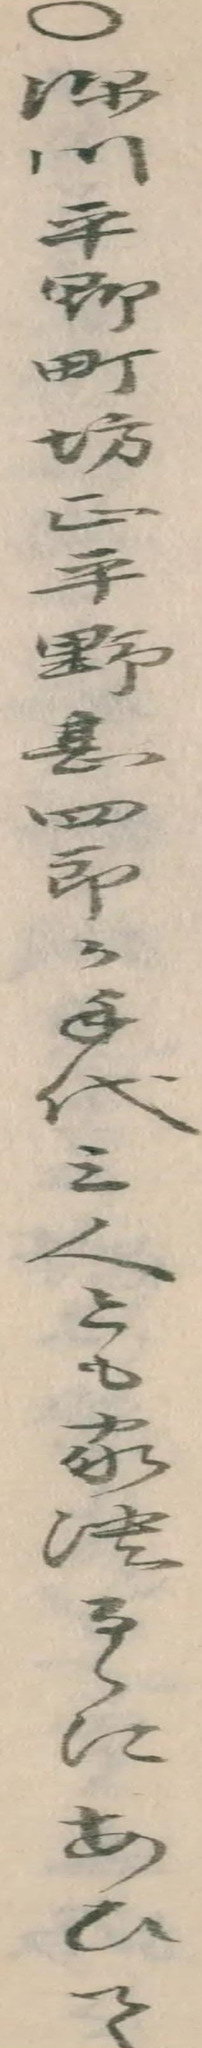〇深川平野町坊正平野甚四郎か手代三人とも家潰るゝにあひて
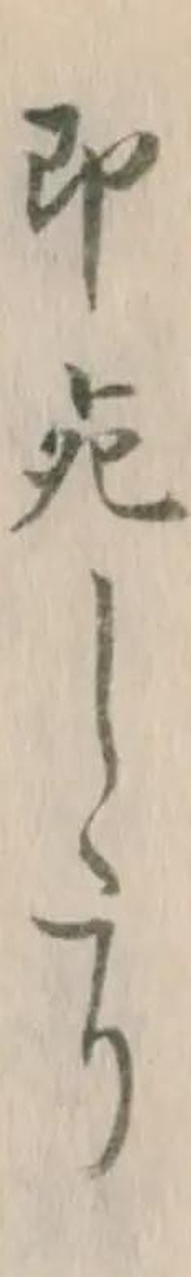即死したり
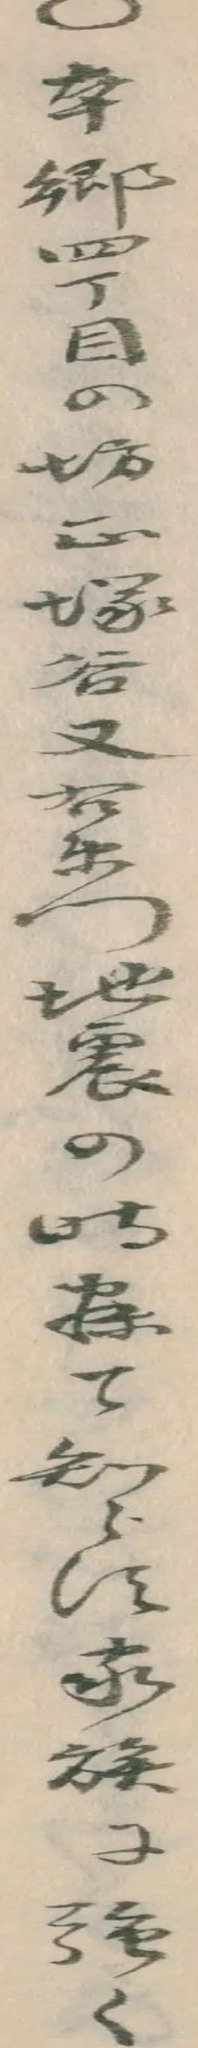〇本郷四丁目の坊正塚谷又右衛門地震の時寐て知らす家族に強く
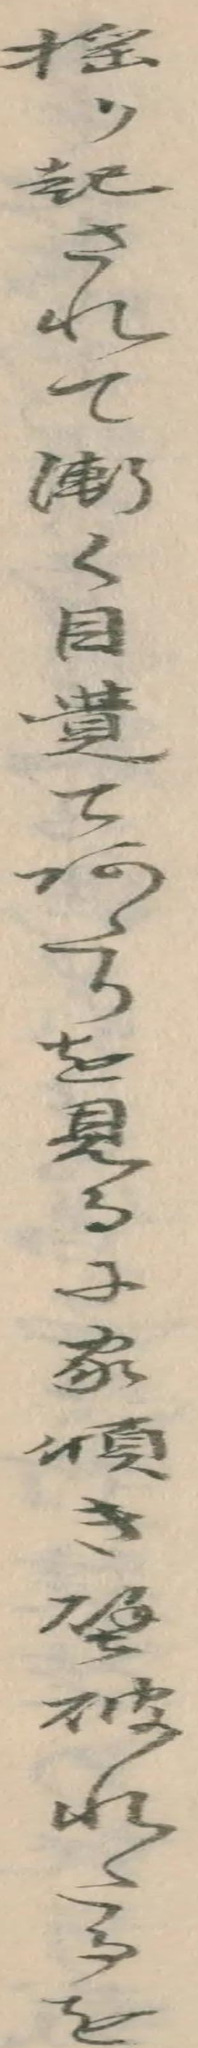揺り起されて漸く目覚てあたりを見るに家傾き壁破れたるを

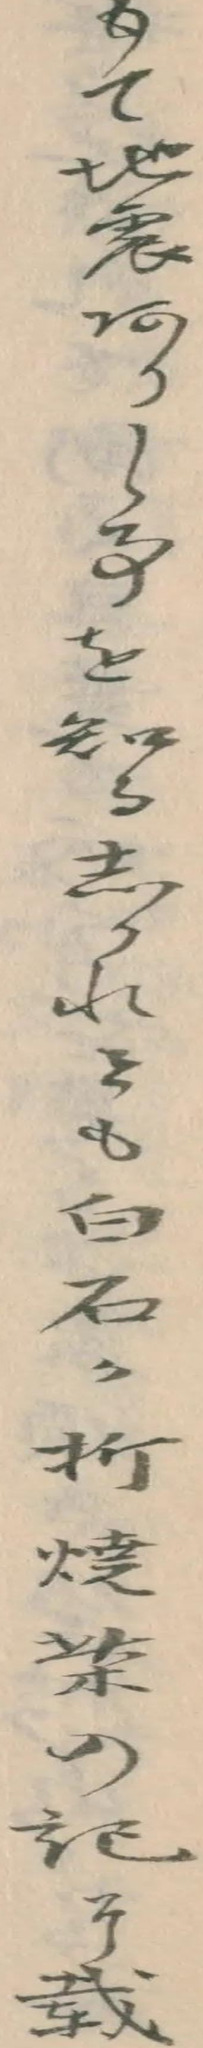もて地震ありし事を知るしかれとも白石か折焼柴の記に載
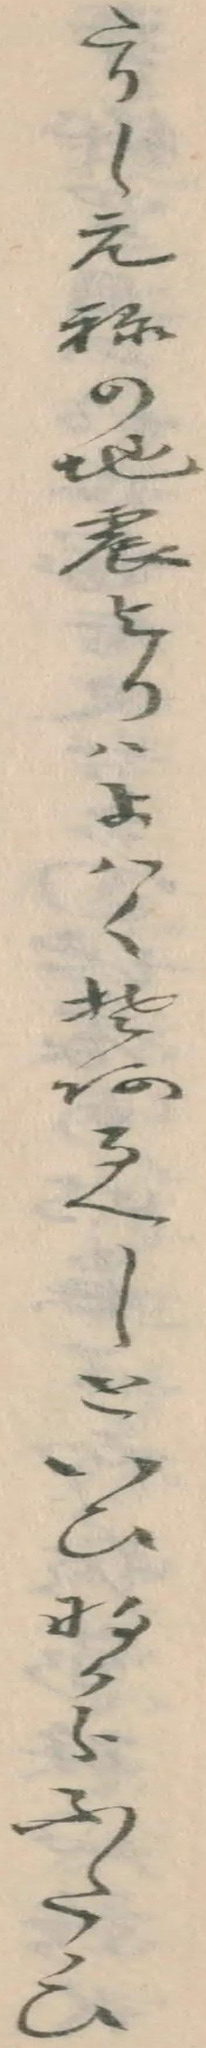たりし元禄の地震よりはよはくそあるへしといひなからふたゝひ
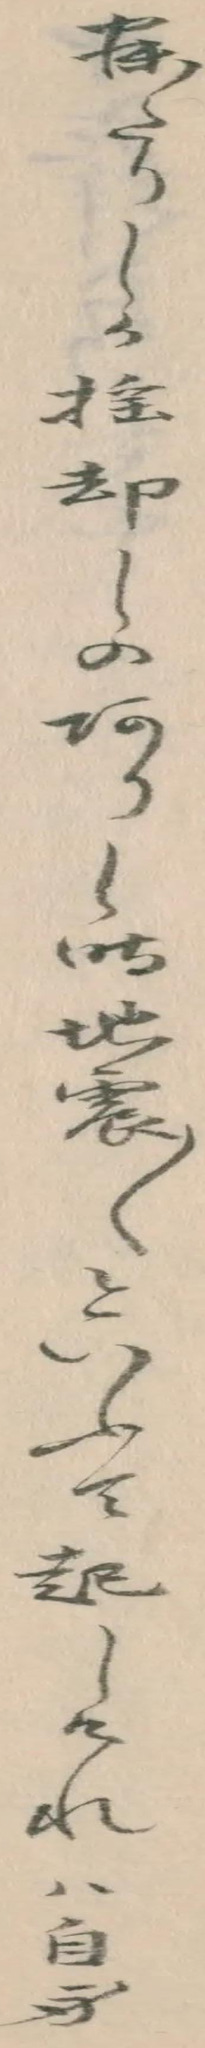寐たりしか揺却しのありし時地震〳〵といふて起しけれは自身
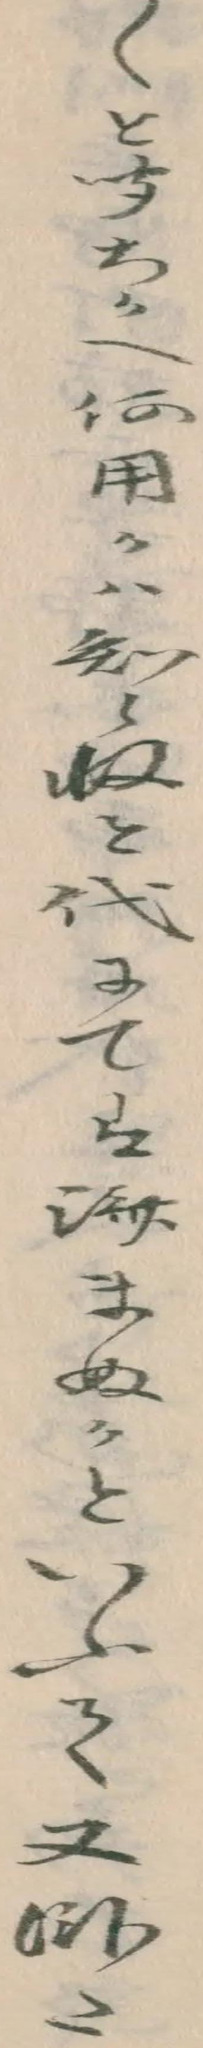〳〵と聞ちかへ何用かは知らねと代にては済まぬかといふて又臥た
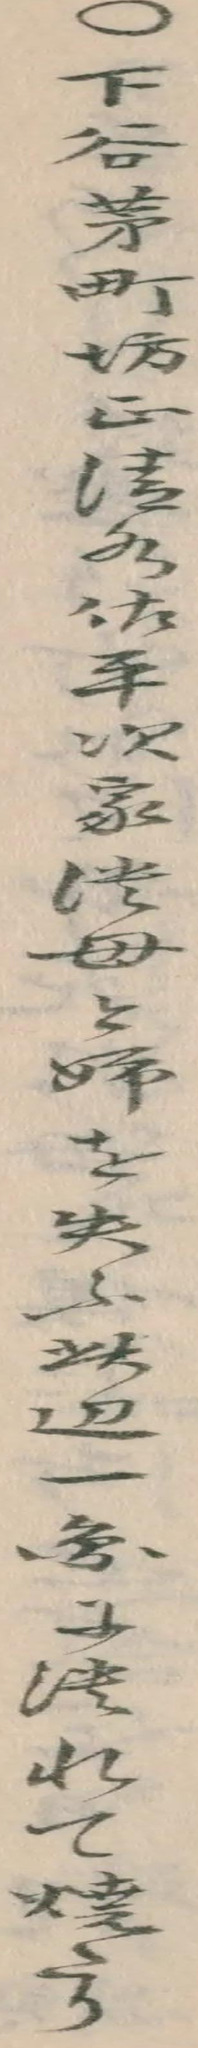〇下谷茅町坊正清水佐平次家潰母と姉を失ふ此辺一円に崩れて焼たり
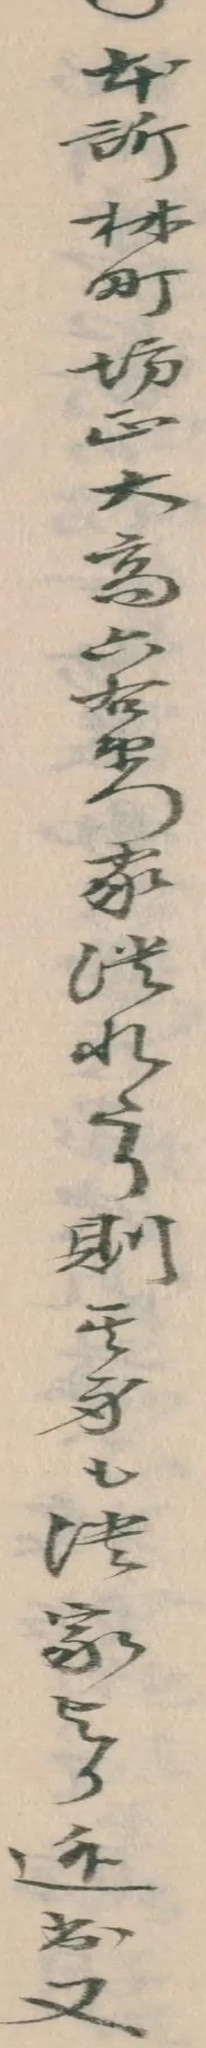〇本所林町坊正大高六右衛門家潰れたり則其身も潰家より逃出又
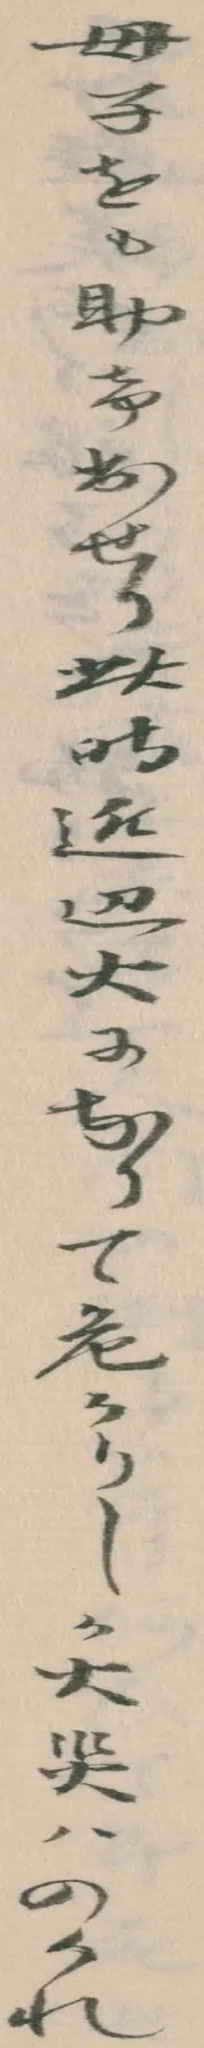母子をも助け出せり此時近辺火になりて危かりしか火災はのかれ
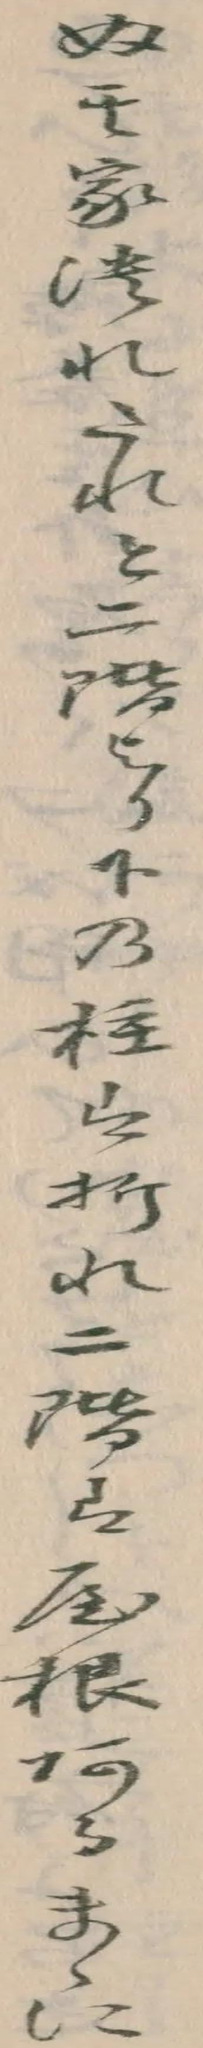ぬ其家潰れたれと二階より下の柱は折れ二階は屋根あるまゝに
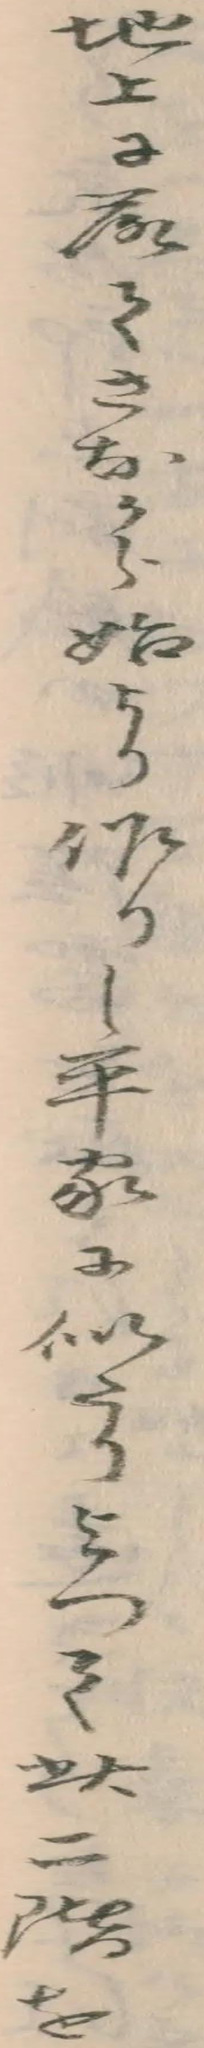地上に落てさなから始より作りし平家に似たりよつて此二階を
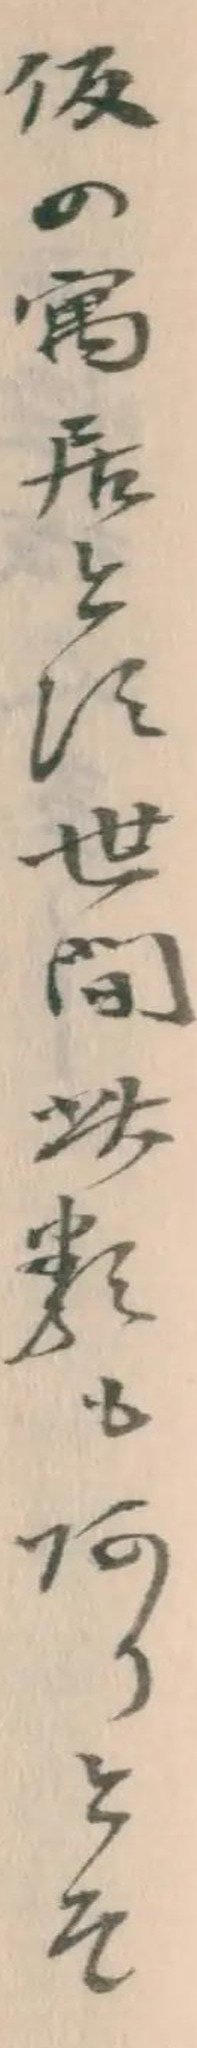仮の寓居とす世間此類もありとそ
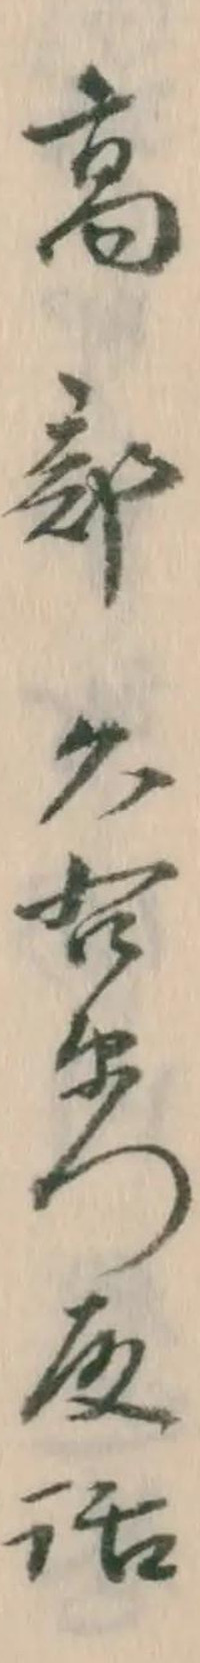高部久右衛門殿話
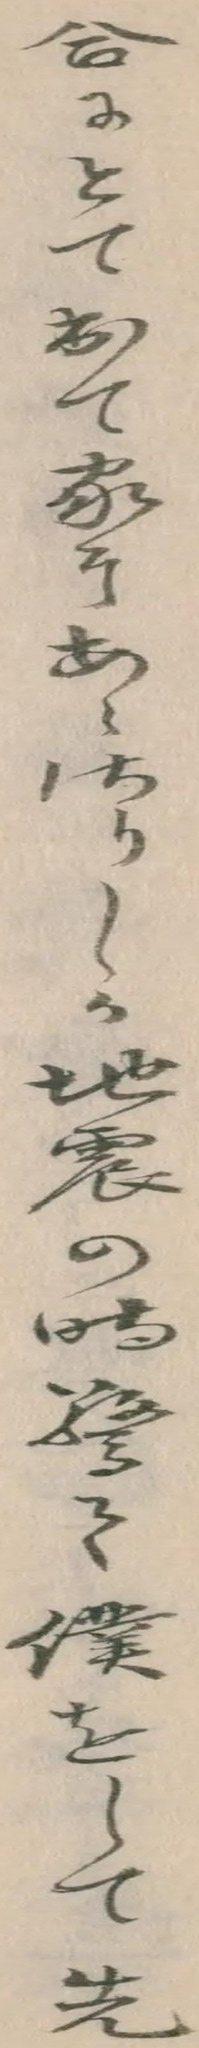合にとて出て家にあらさりしか地震の時驚て僕をして先
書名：地災撮要. 巻7-9(地震之部)
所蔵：国立国会図書館 National Diet Library, JAPAN
